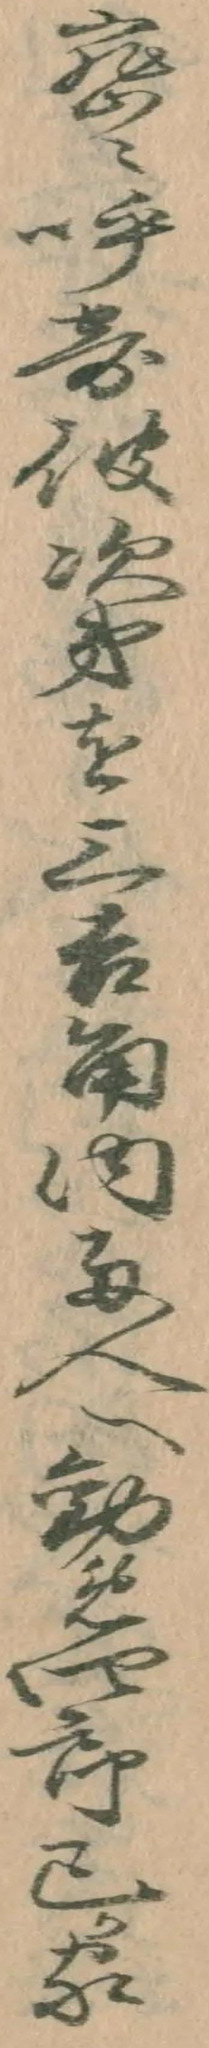密に呼寄彼次第を三吉角内両人へ勧め四郎己か家
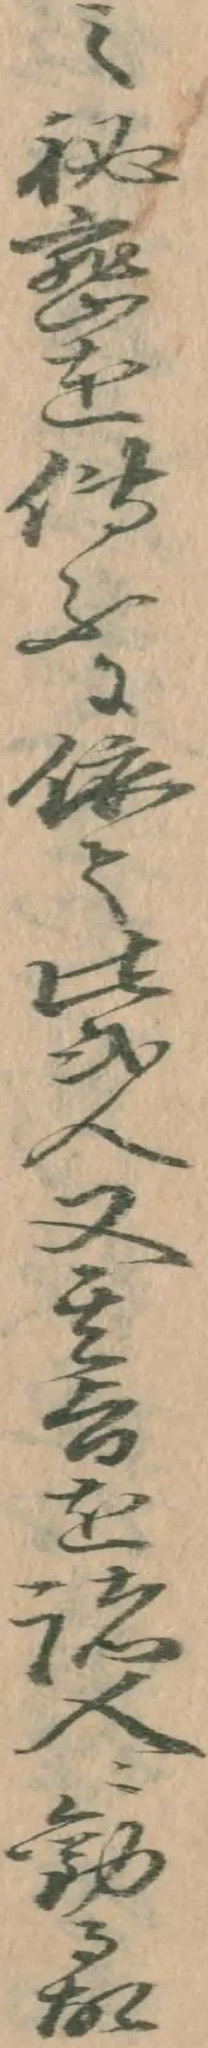之秘密を伝ふに依て此弐人又其旨を諸人に勧る故
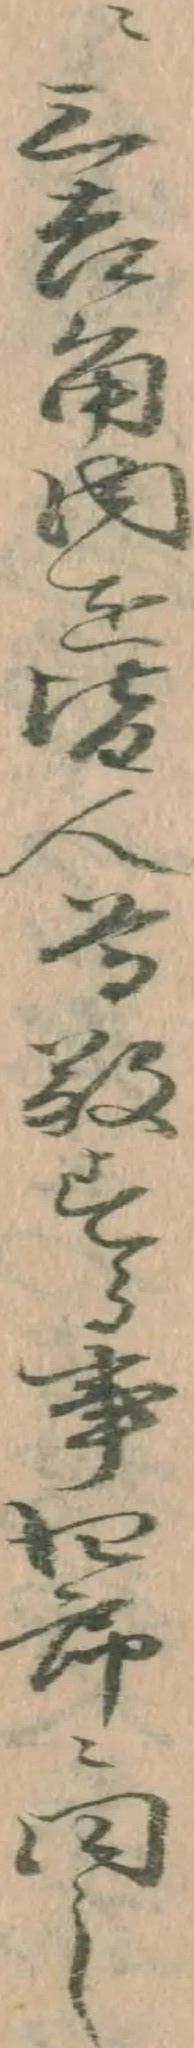に三吉角内を皆人尊敬する事四郎に同し
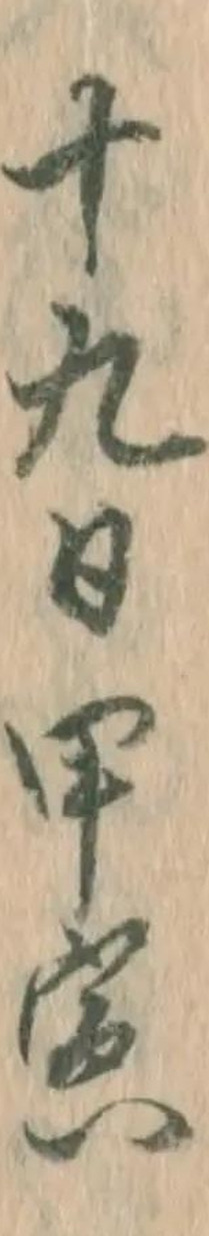十九日甲寅
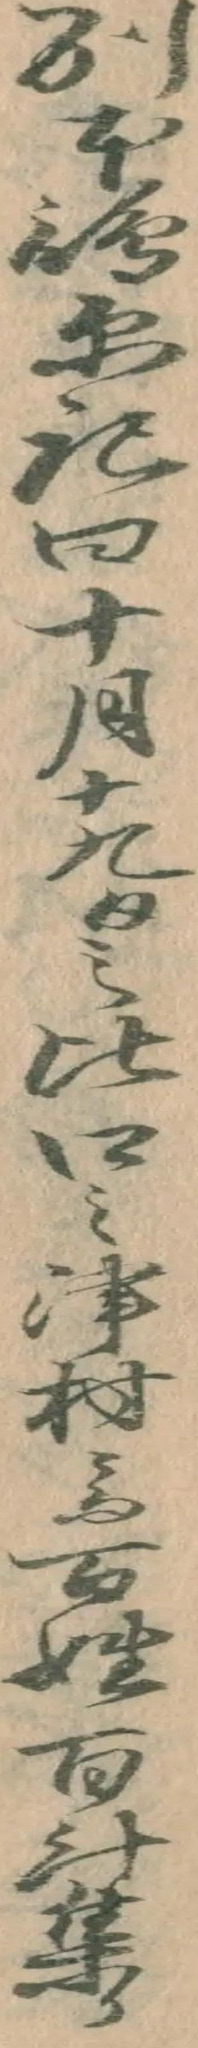別本島原記日十月十九日之比口之津村に而百姓百斗集り
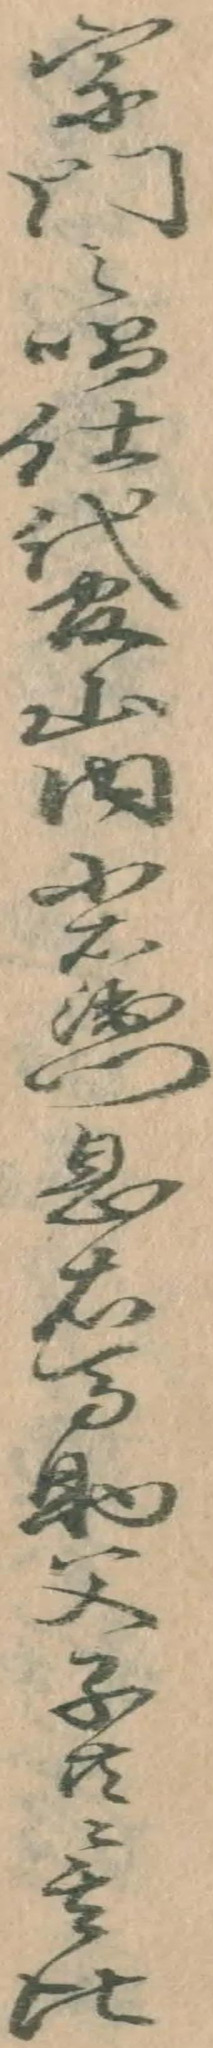宗門之唱仕代官山内小右衛門息右馬助父子共に其比
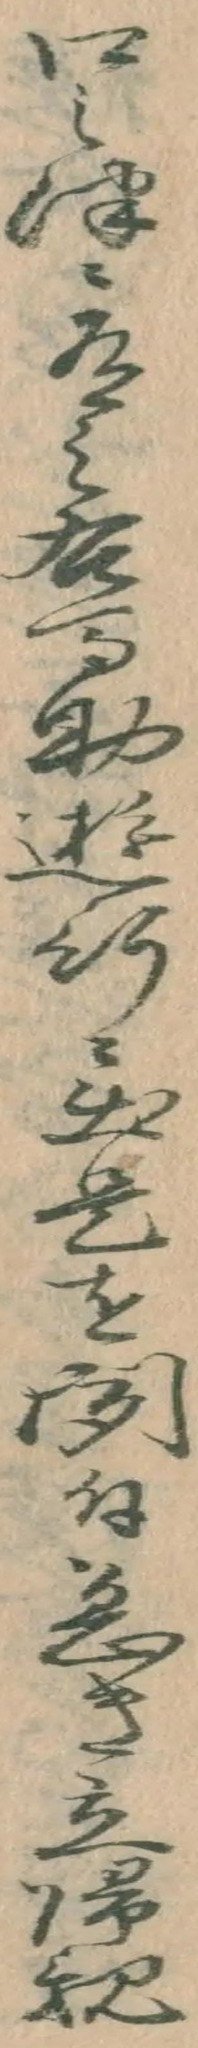口之津に有之右馬助遊行に出是を聞付急き立帰親
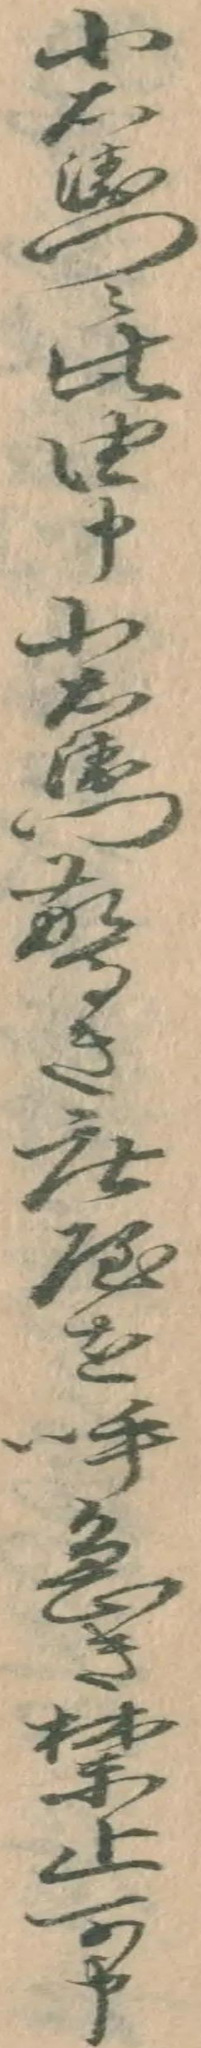小右衛門に此由申小右衛門驚き庄屋を呼急き禁止可申
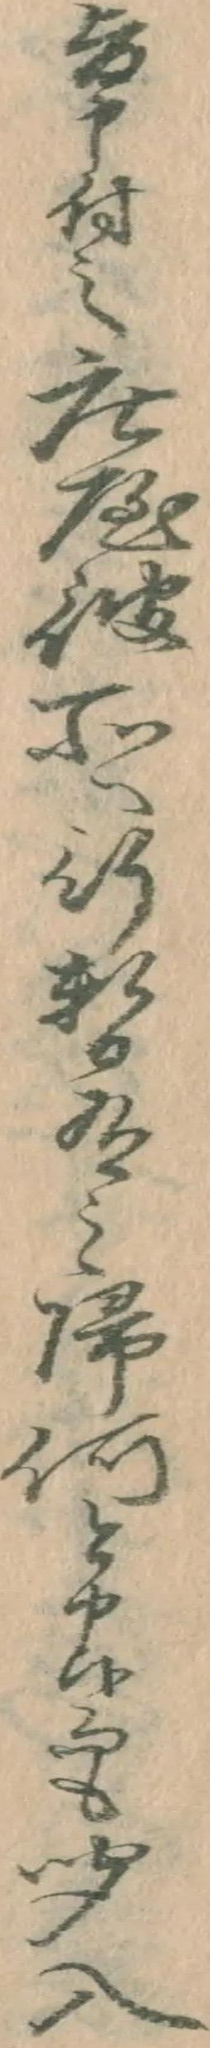旨申付之庄屋彼所へ行暫有之帰何と申候而も聞入

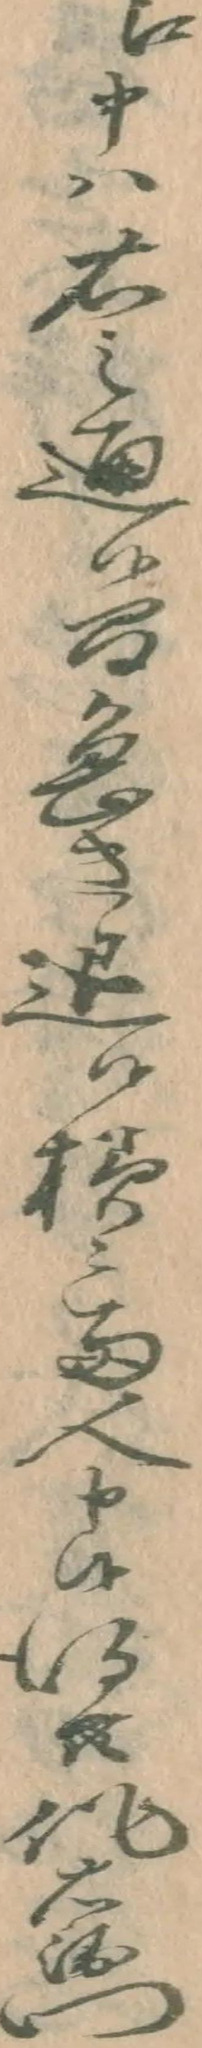え申は右之通候間急き退候様に両人申候得共作右衛門
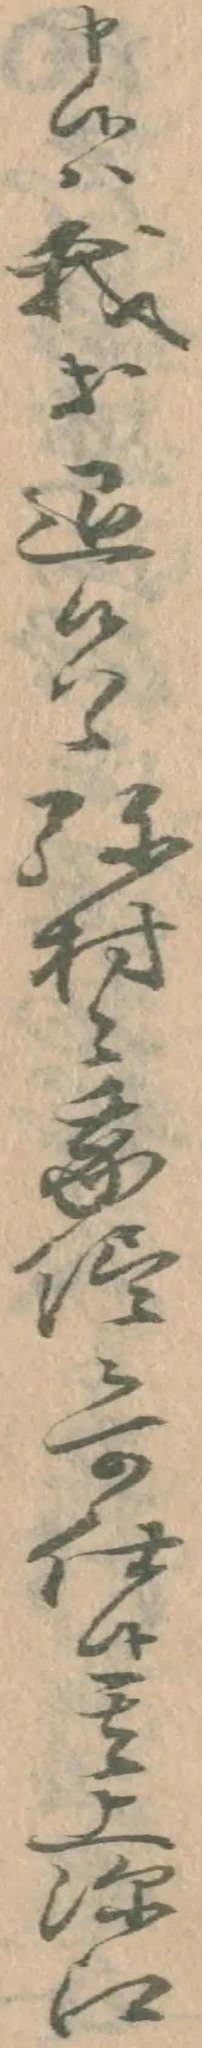申候は我等退候はゝ弥村々我侭に可仕候其上深江
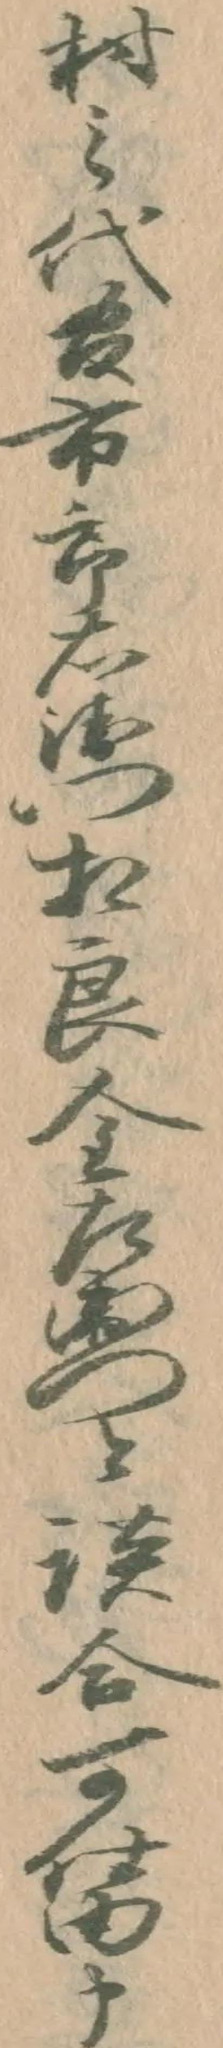村之代官市郎右衛門相良金左衛門と談合可仕由申
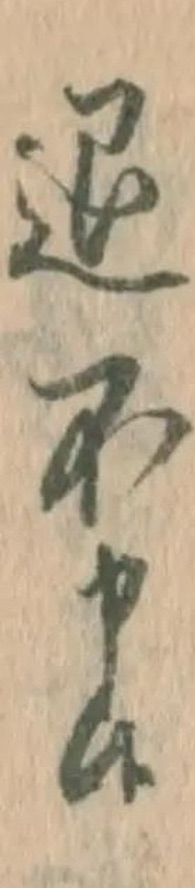退不申候
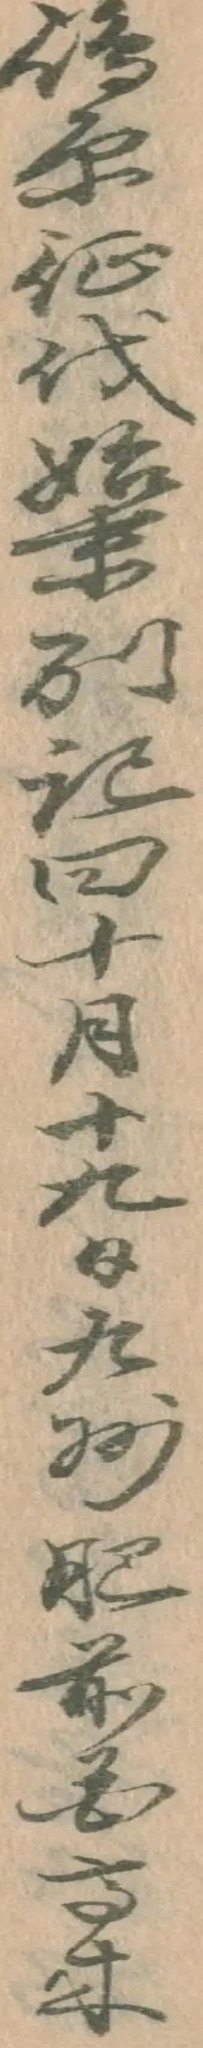島原征伐始末別記日十月十九日九州肥前国高来
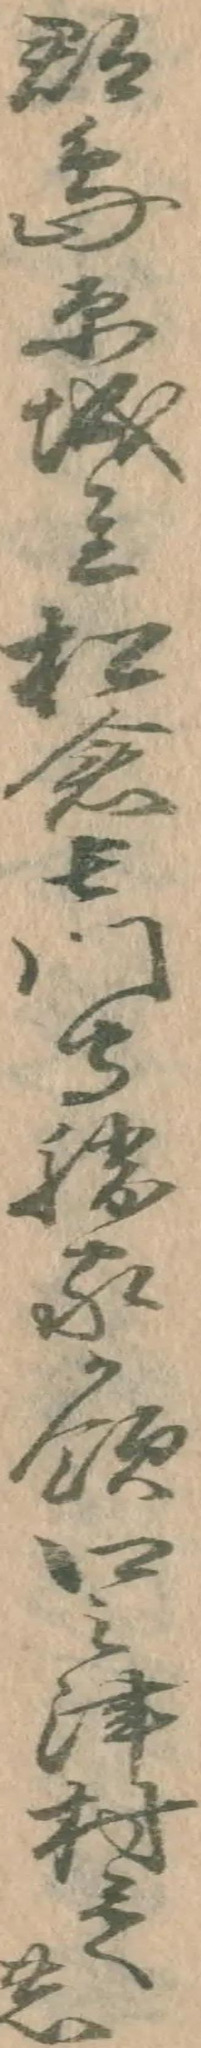郡島原城主松倉長門勝家か領口之津村にて農
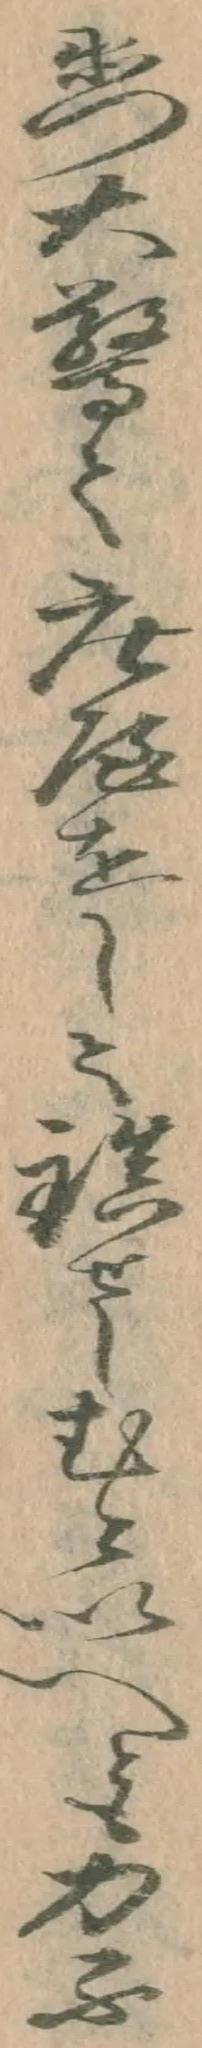衛門大驚て庄屋をして鎮せしむといへとも力不
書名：切支丹御退治記 49巻. [1]
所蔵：国立国会図書館 National Diet Library, JAPAN
